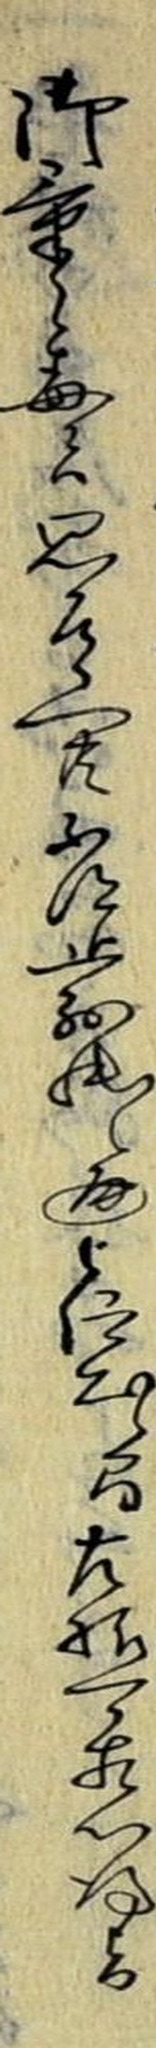御気之毒ニハ思召候へ共不得止別紙之通被仰出候間左様可相心得旨
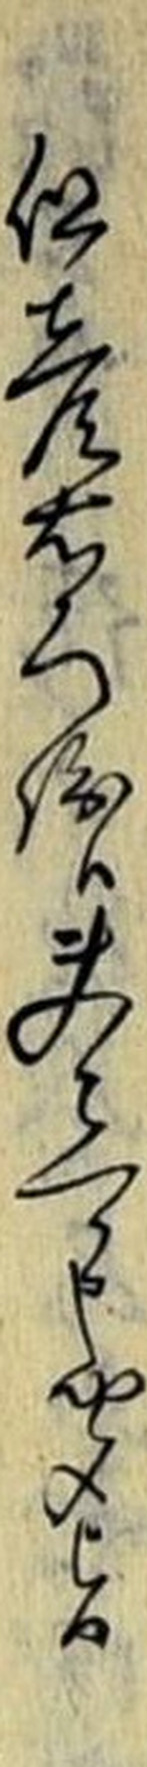但彦右衛門儀ハ夫々可申聞旨
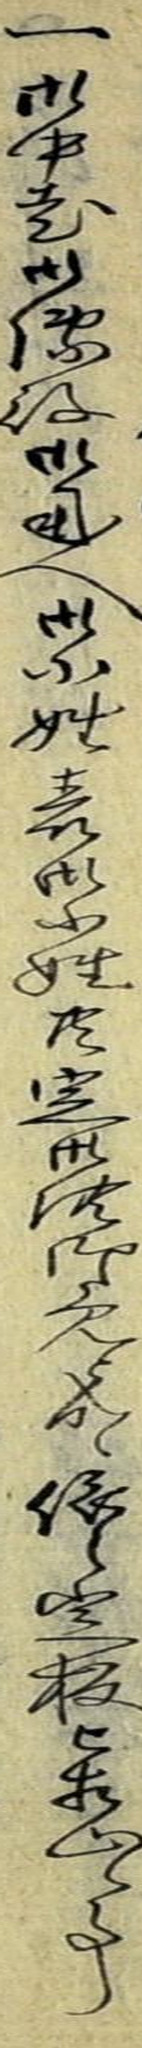一御中老御傅役御用人御小姓表御小姓共定御供御免被成候依之定板被相止候事
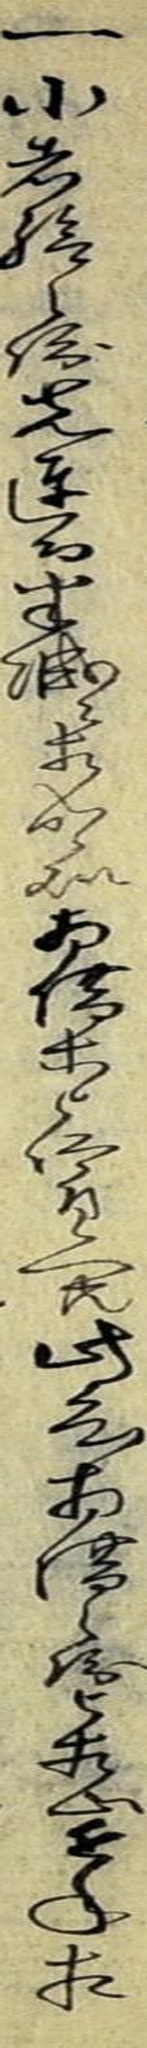一小者給之儀先達而半減ニ相成候処拝借等被仰付候へ共此度拝借之儀被相止近年相
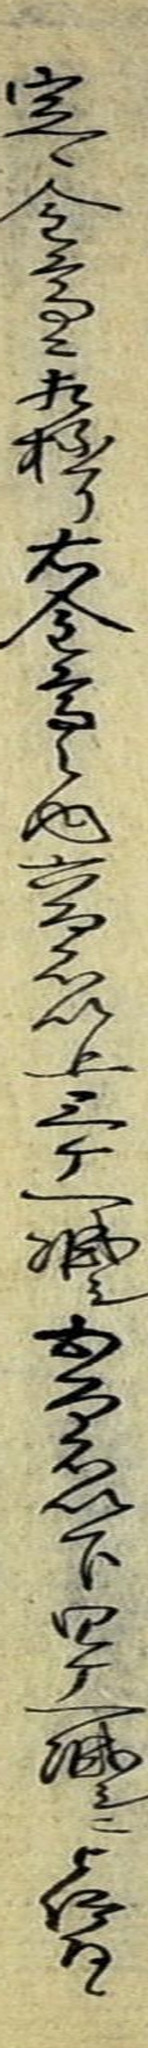定候金高ニ相極り右金高之内六百石以上三ケ一減シ五百石以下四ケ一減シニ被仰付候
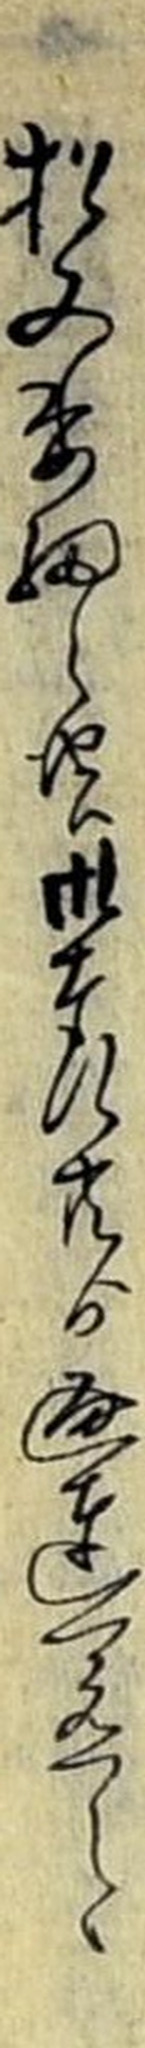猶又委細之儀ハ御奉行共ゟ通達有之候
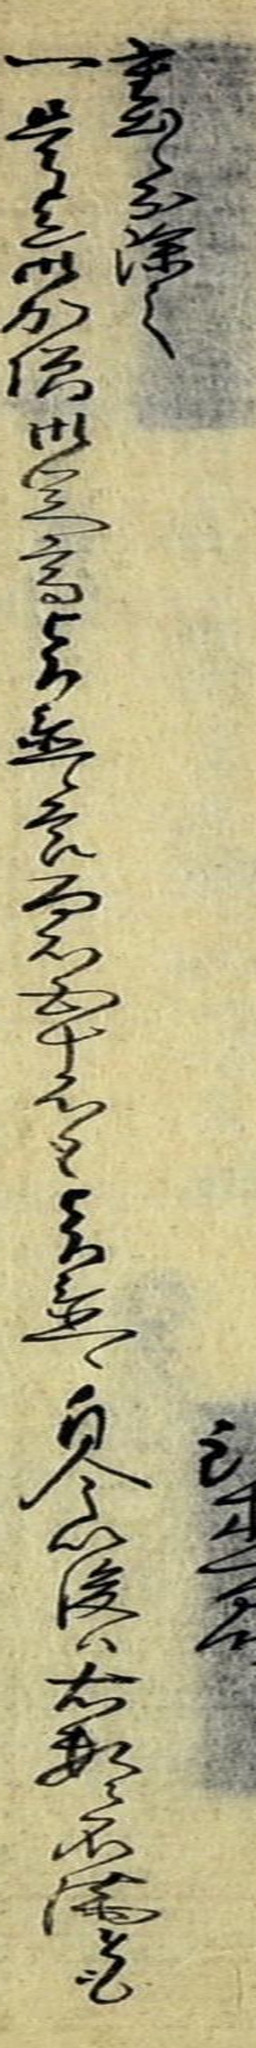一是迄御加増御定高被下置候節百石五十石ツヽ被下置候自今以後ハ右数ニ不満とも
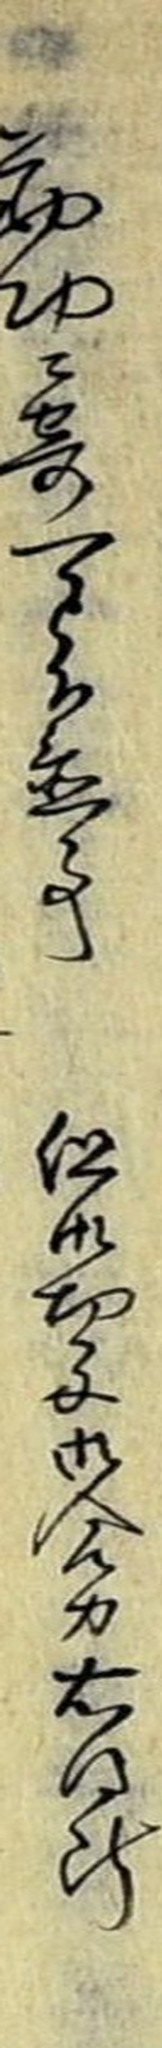勤功ニ寄可被下置事但御切米御合力右同断
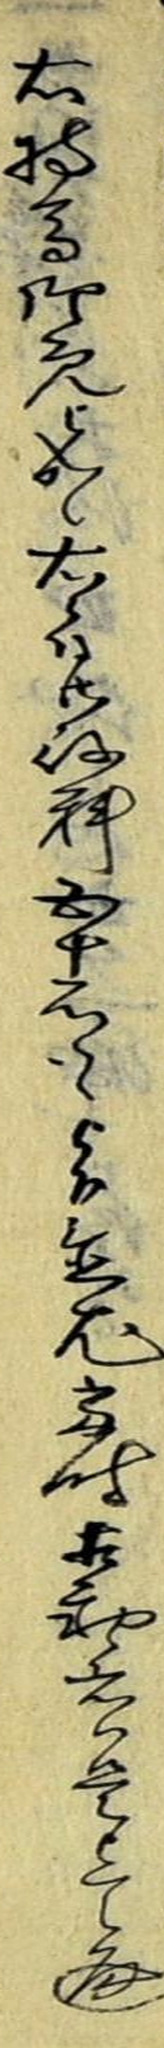右持馬御免被成候右ニ付御役料五十石ツヽ被下置尤当時相勤者ハ是迄之通

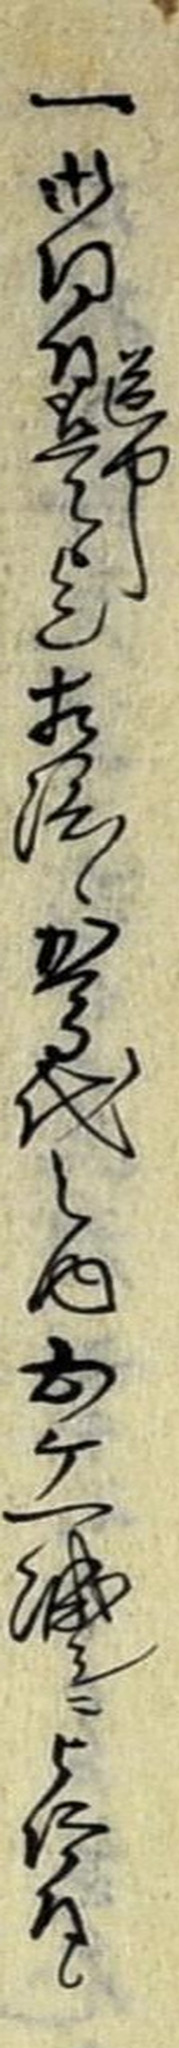一御目付道中是迄相渡候駕代之内五ケ一減シニ被仰付候
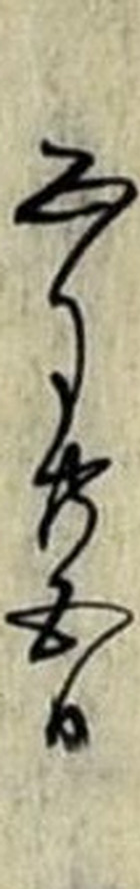正月廿五日
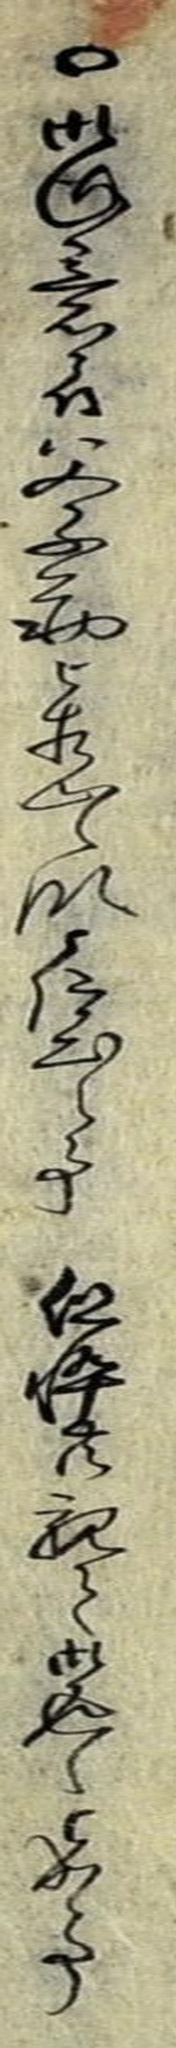〇御趣意ニ付父子勤被相止候段被仰出候事但忰共親々へ御返し被成候事
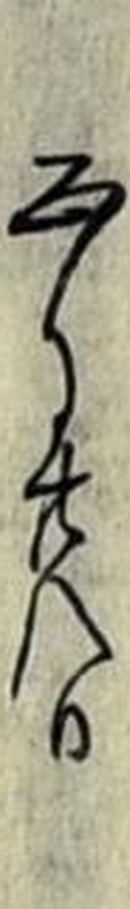正月廿八日
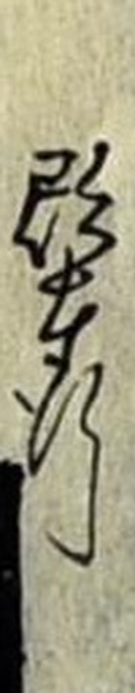郡奉行
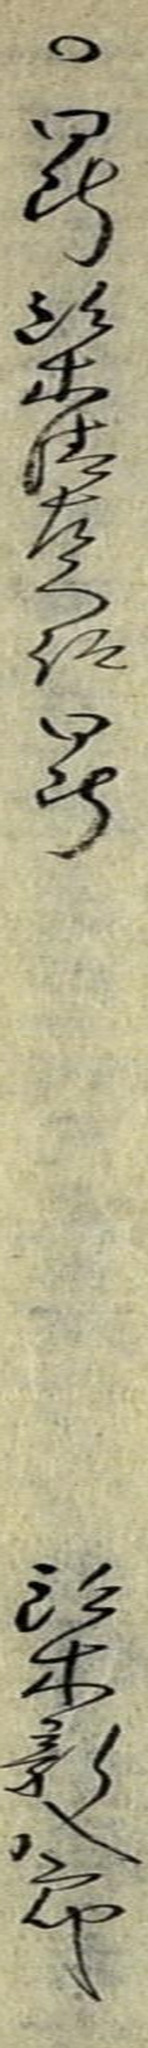〇同断鈴木清左衛門跡同断鈴木新八郎
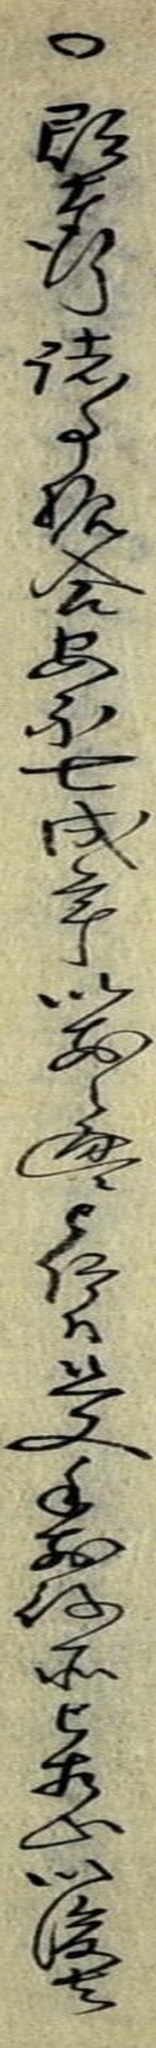〇郡奉行諸事振合安永七戌年以前之通ニ被仰付且又手前役所被相止以後者
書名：命令之部 三
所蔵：福井県文書館 Fukui Prefectural Archives
